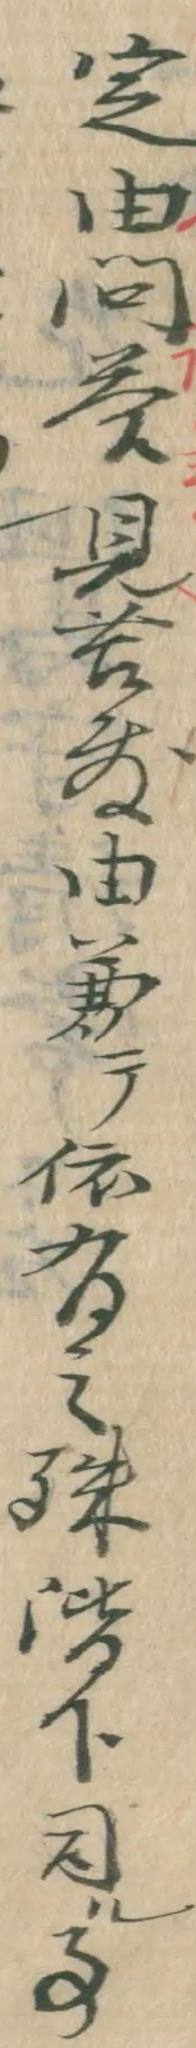定由問答見苦敷由兼テ依有之殊階下司ル事
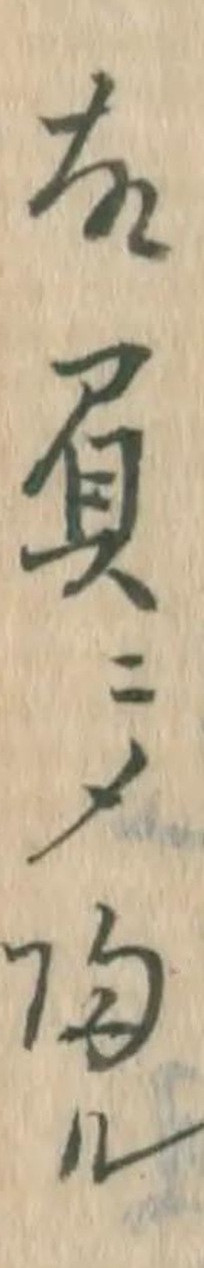故負ニシテ帰ル

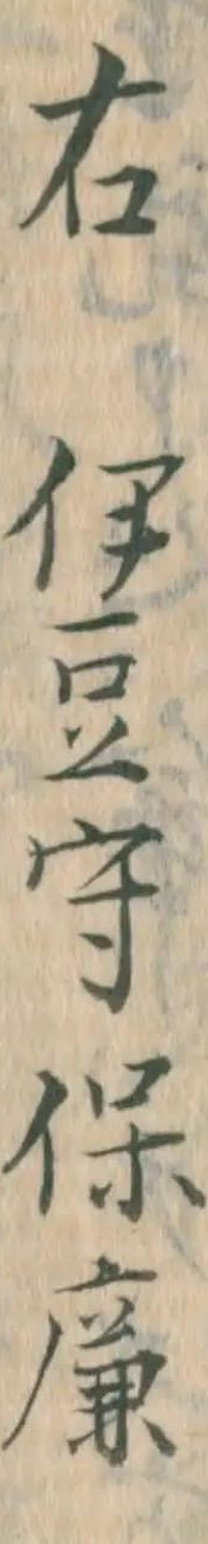右伊豆守保廉
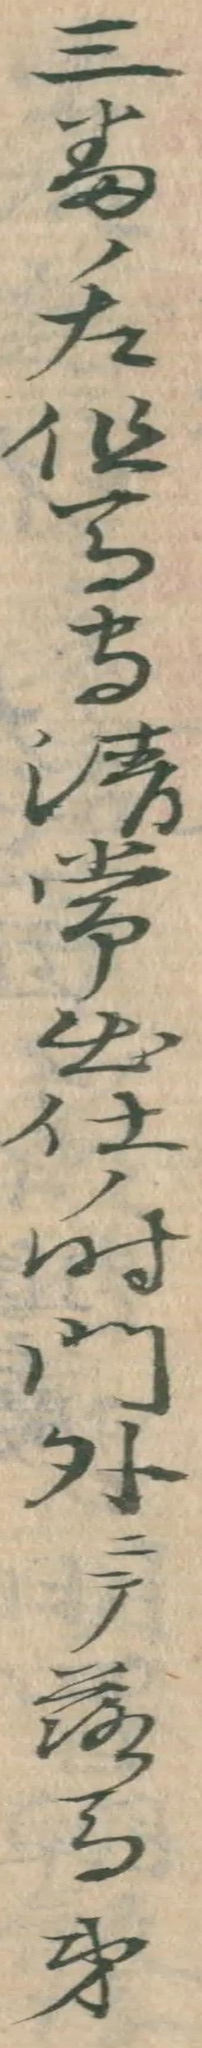三番ノ左但馬守清常出仕ノ時門外ニテ落馬弟
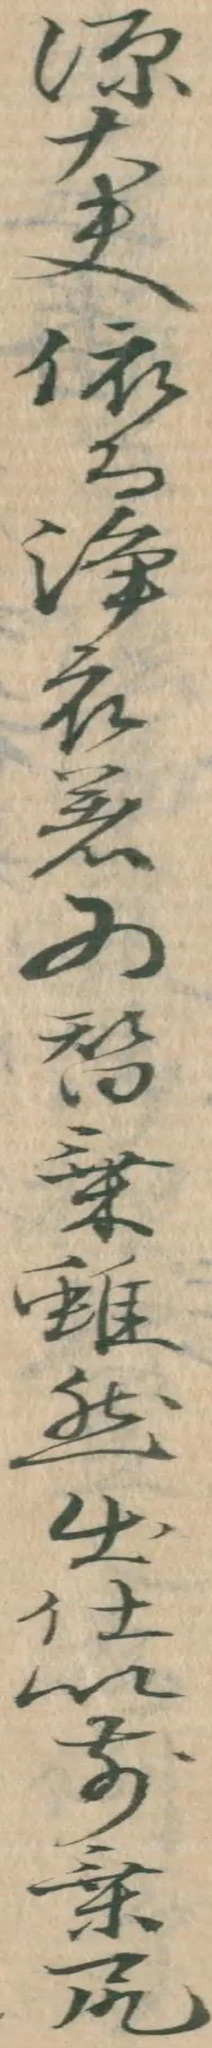源大夫依而浄衣着為替乗雖然出仕以前乗尻
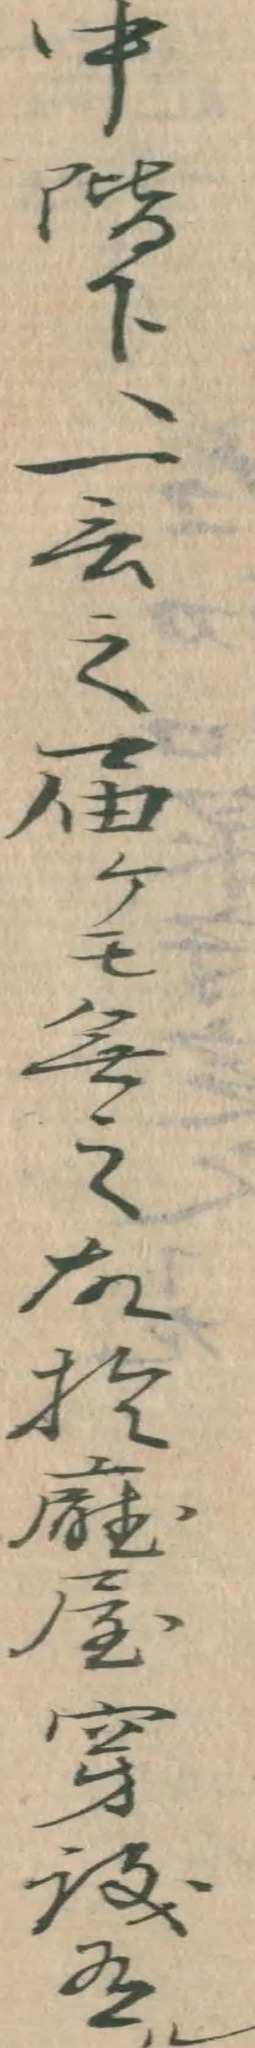中階下へ一言之届ケモ無之故於庁屋穿議有ル
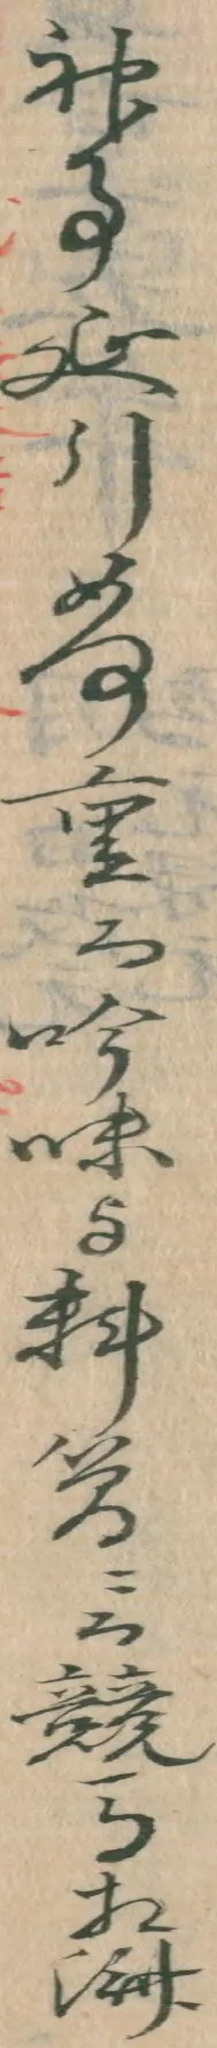神事延引如何重而吟味与料簡ニ而競馬相済
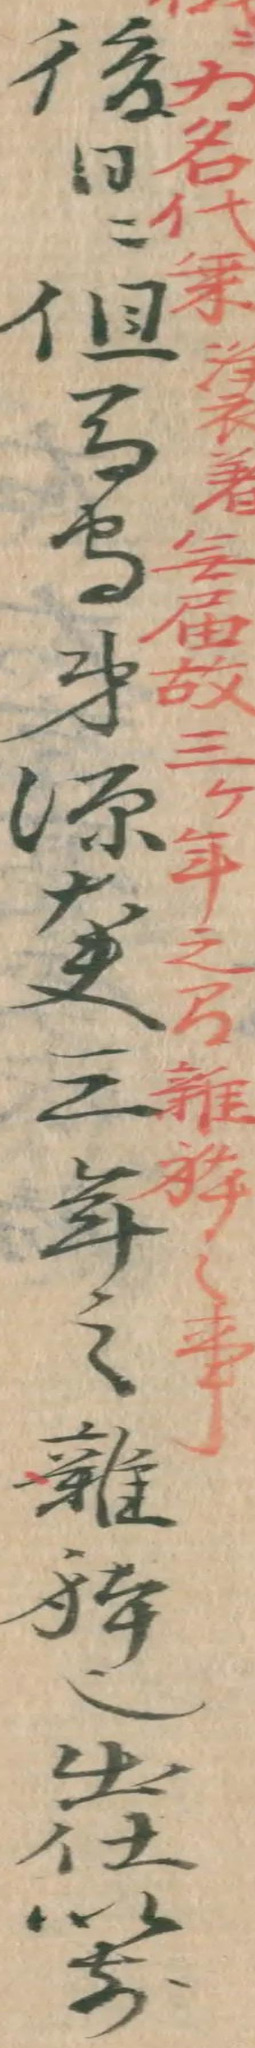後日ニ但馬守弟源大夫三年之雑体也出仕以前
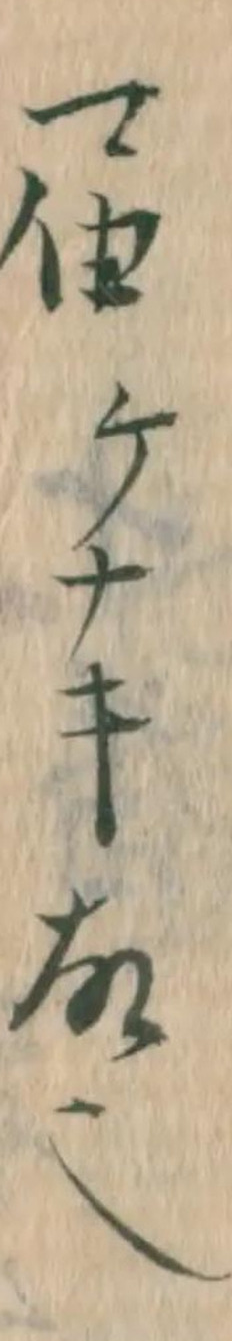届ケナキ故也
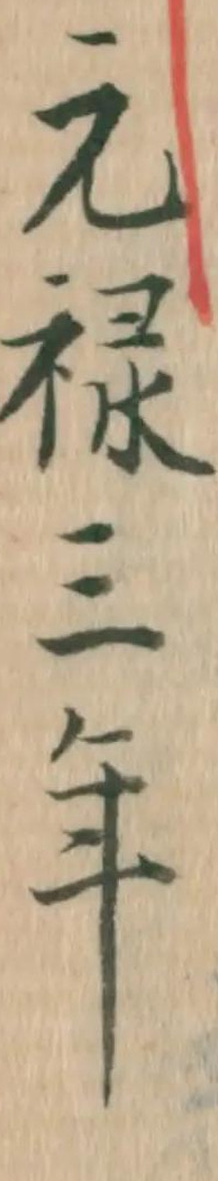元禄三年
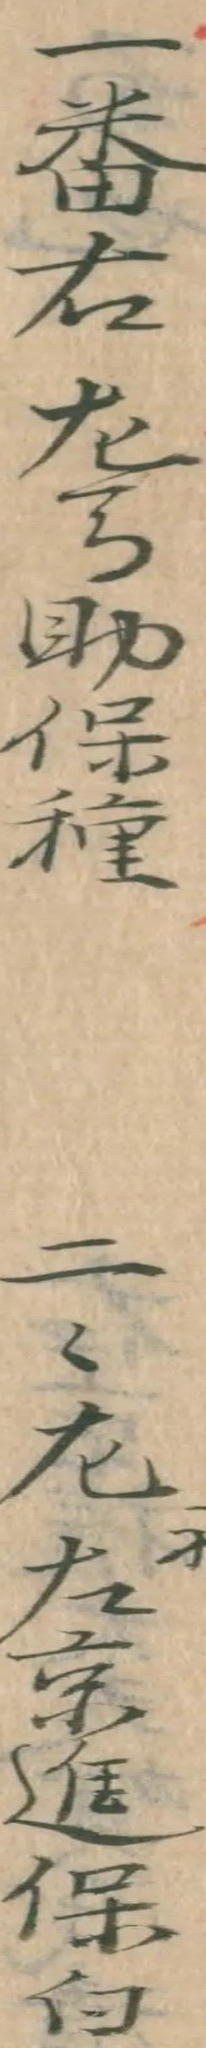一番右左馬助保種二々左左京進保白
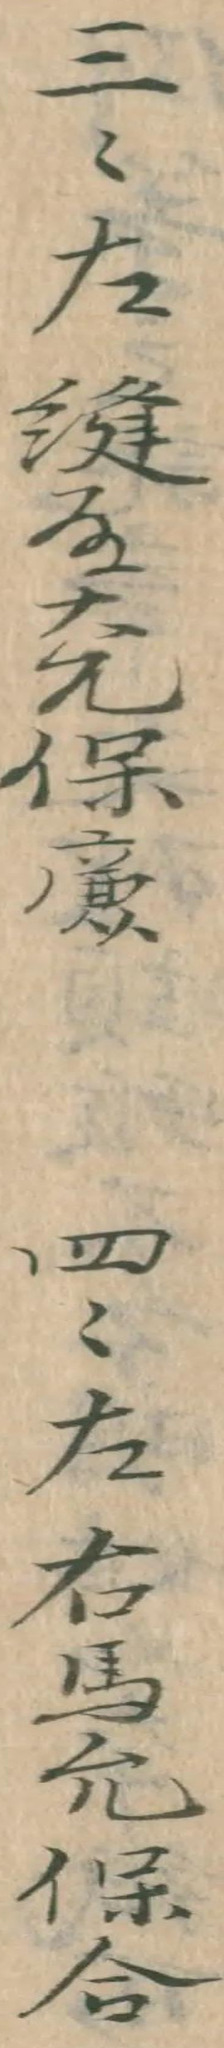三々左縫殿大允保廉四々左右馬允保合
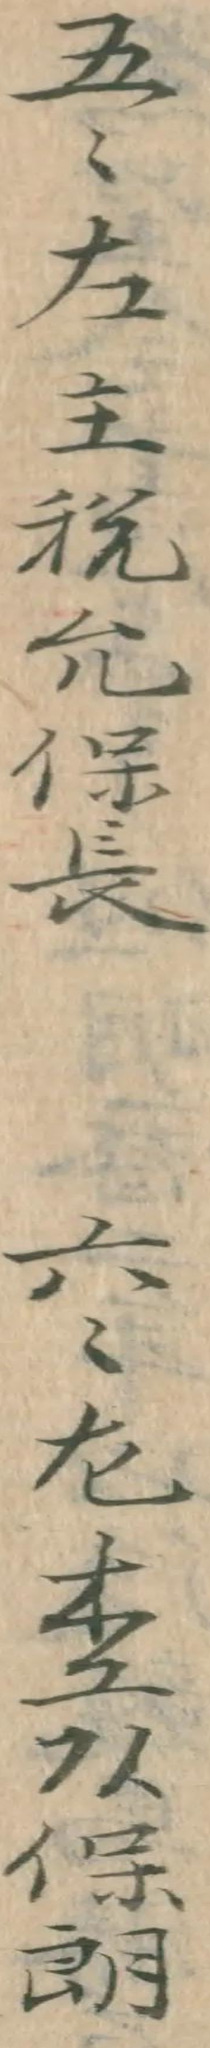五々左主税允保長六々左木工頭保朗
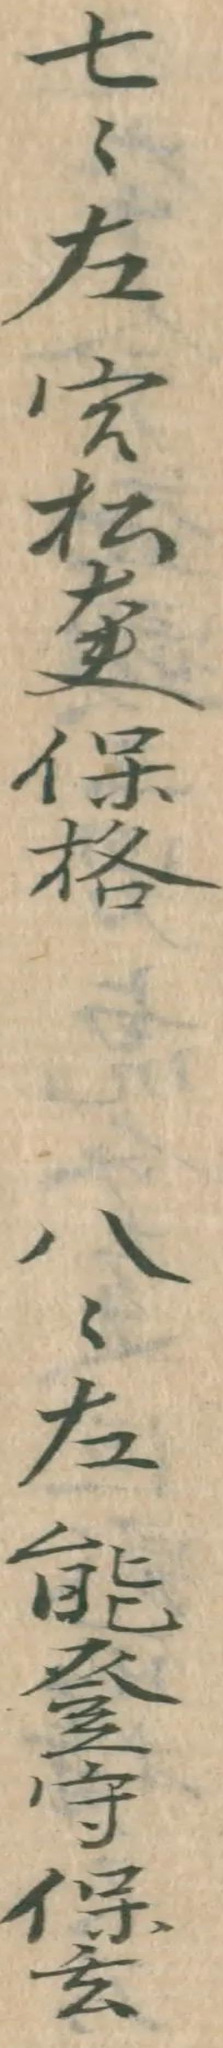七々左宮松大夫保格八々左能登守保玄
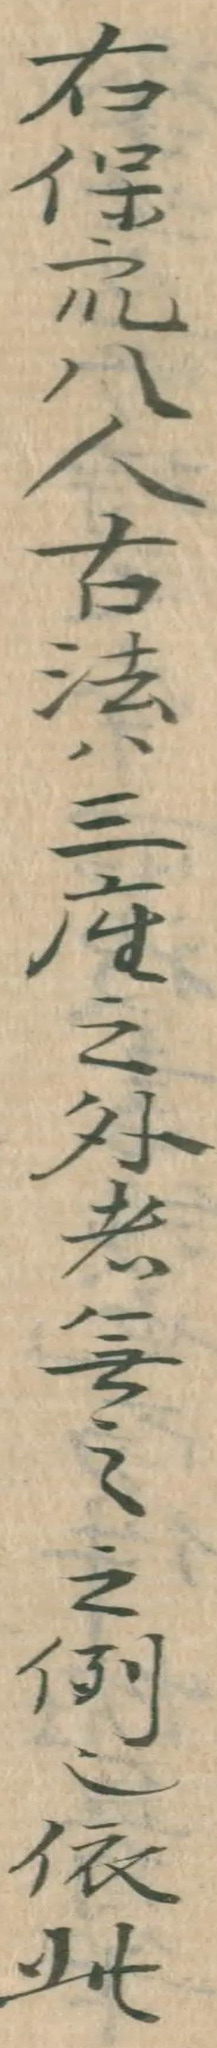右保衆八人古法ハ三座之外者無之之例也依此
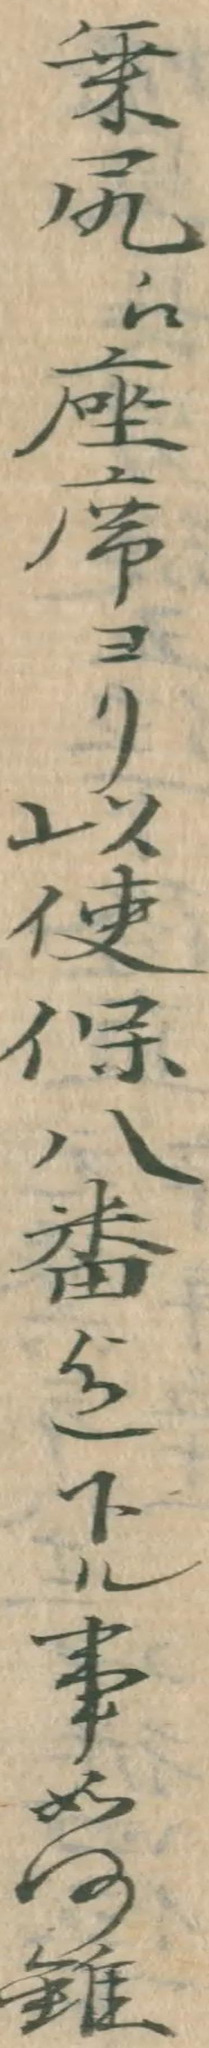乗尻江座席ヨリ以使保八番迄下ル事如何雖
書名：賀茂社記録. 第10冊
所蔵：国立国会図書館 National Diet Library, JAPAN
